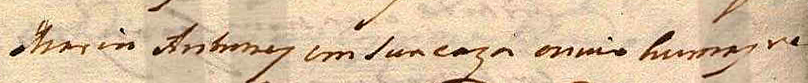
Maria Antunes em sua caza ouuio humas re
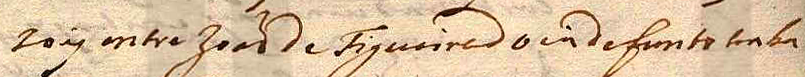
zois entre Joaõ de Figueiredo ia defunto traba
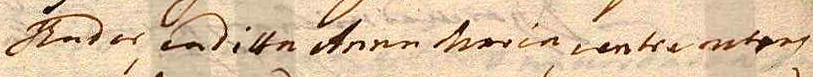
lhador, e a ditta Anna Maria, e entre outras
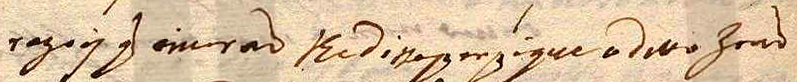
razois q̄ ouuiraõ lhe disse por pique o ditto Joaõ
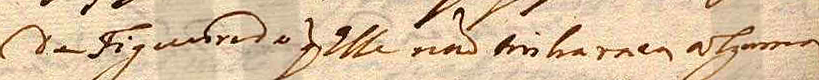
de Figueiredo q̄ Elle naõ tinha raça alguma
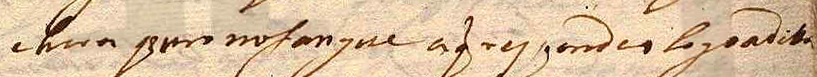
e hera puro no sangue a q̄ respondeo logo a ditta
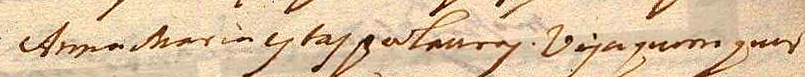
Anna Maria estas palauras. Veja quem quer
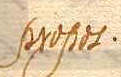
propos.
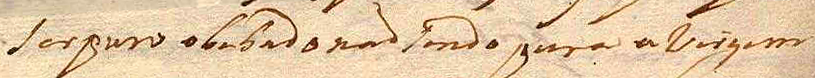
ser puro o bebado naõ sendo pura a Virgem
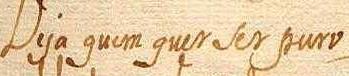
Veja quem quer ser puro
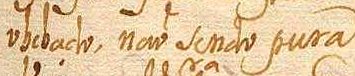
o bebado, naõ sendo pura
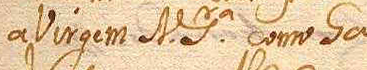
a Virgem N. S.ra como ha
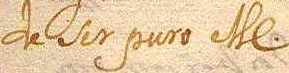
de ser puro elle.
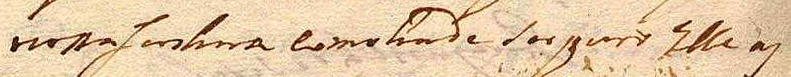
nossa senhora como ha de ser puro Elle as
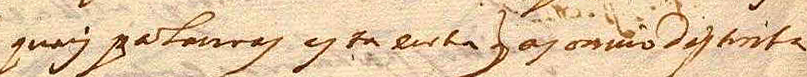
quais palauras esta certa q̄ as ouuio de q̄ tinha
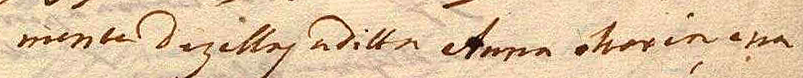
mente dizellas a ditta Anna Maria e na
